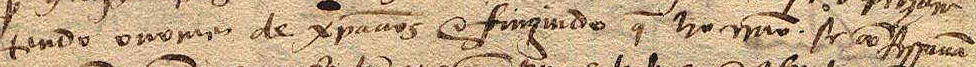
tendo o nome de xpãaos e fingindo q̄ ho erão se c̄ofessaūa
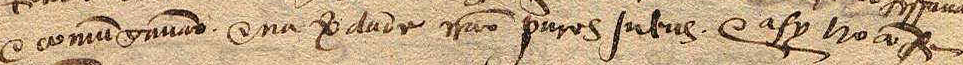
e comūgauão e na ꝟdade erão puros Judeus e asy ho c̄ofe
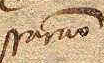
ssarão
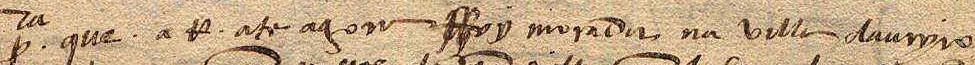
p.ra que a R. ate agora ffoy morador na villa daueyro
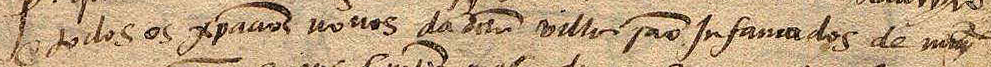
e todos os xpãaos nouos da dita villa são Jnfamados de muyto
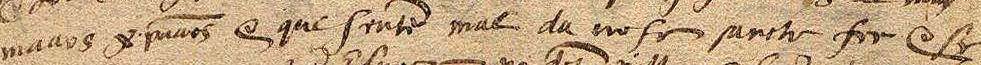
maaos xpãaos e que sentē mal da nosa sancta fee e se
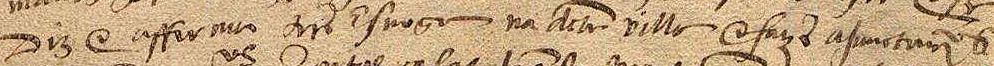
Diz e affirma terē Esnoga na d̄cta villa e fazē aJunctamtos
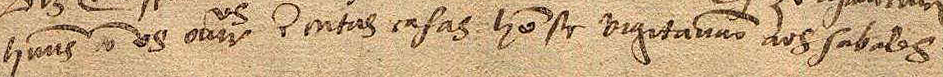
hūua c̄o os outros ē certas casas hō se vigitauão aos sabados
